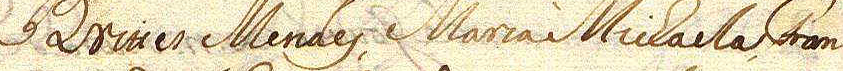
Brittes Mendes, Maria Michaela, Fran
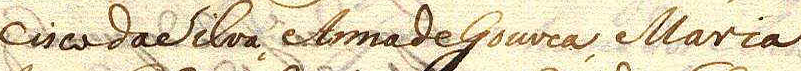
cisco da Silva, Anna de Gouvea, Maria
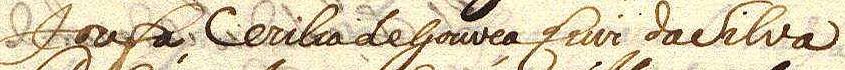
Jozefa, Cezilia de Gouvea, Luiz da Silva
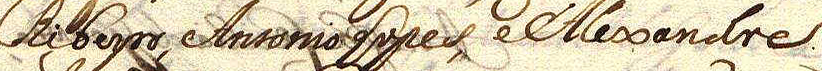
Ribeyro, Antonio Lopes, e Alexandre
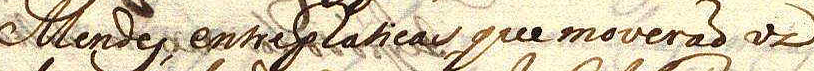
Mendes, entre praticas que moveraõ oz
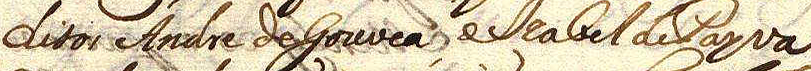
ditos Andre de Gouvea, e Izabel de Payva
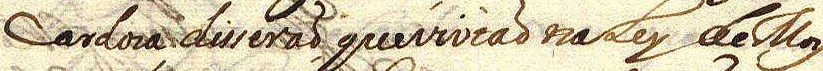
Cardoza, disseraõ que viviaõ na Ley de Moy
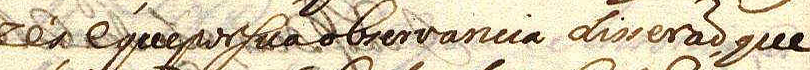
zés, e que por sua observancia disseraõ, que
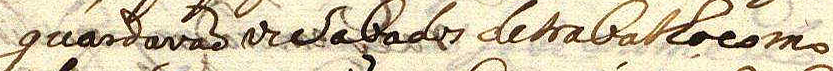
guardavaõ os Sabados de trabalho como
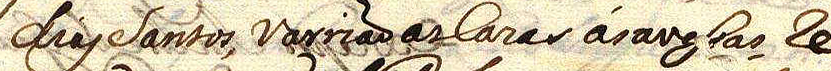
dias Santos, varriaõ as cazas ás avessas, Re
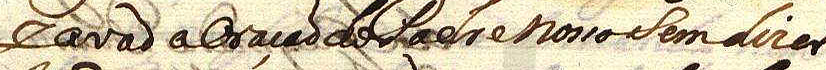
zavaõ a Oraçaõ do Padre nosso sem dizer
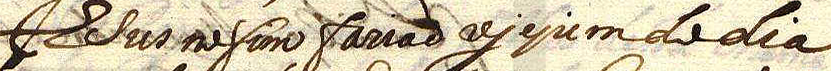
JESus no fim, faziaõ o jejum do dia
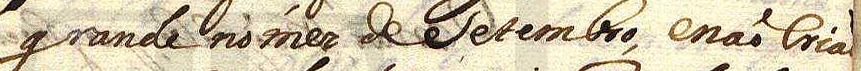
grande no mez de Setembro, e naõ Cria_
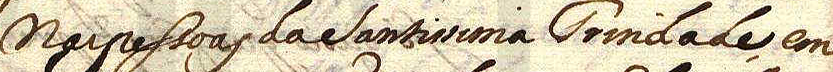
nas pessoas da Santissima Trindade, em
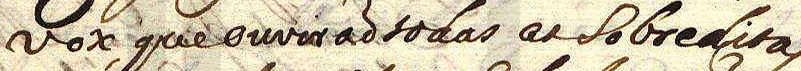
vox, que ouviraõ todas as sobreditas
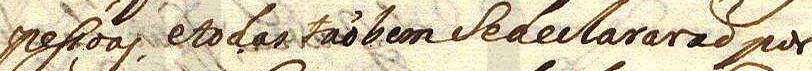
pessoas, e todas taõbem se declararaõ por
